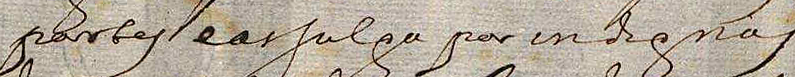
partes, e as julga por indignas
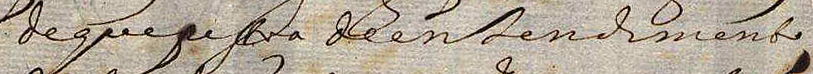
de que pessoa de entendimento
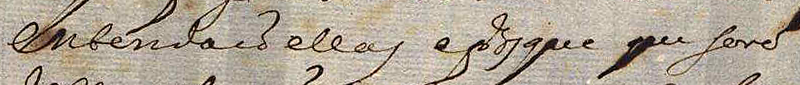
entenda cō ellas e pa os que quiserē
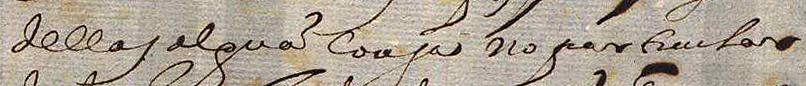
dellas alguā cousa no particular
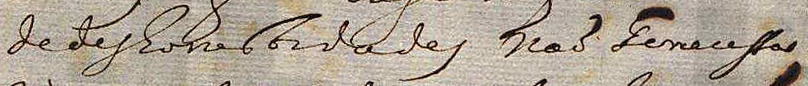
de deshonestidades naõ he necessa
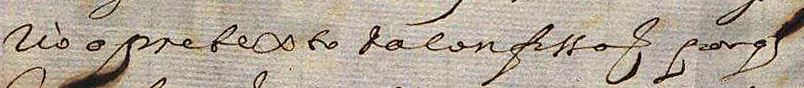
rio o pretexto da confissaõ porq̄
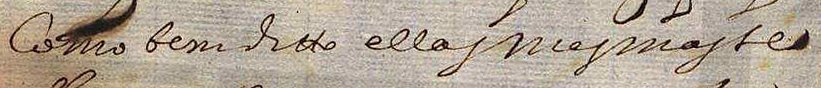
como tem ditto ellas mesmas se
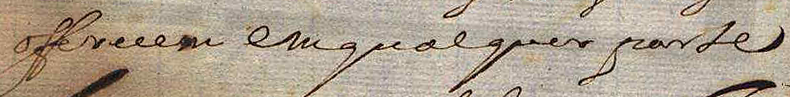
offerecem em qualquer parte
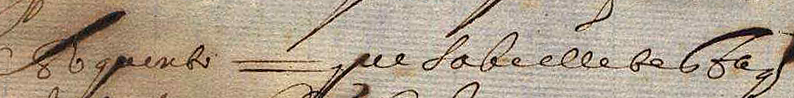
Ao quinto = que sabe elle testa q̄
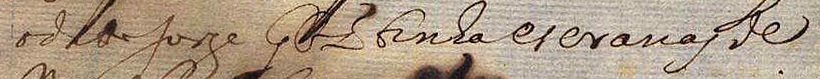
o dito Jorge Glz̄ tinha escrauas de
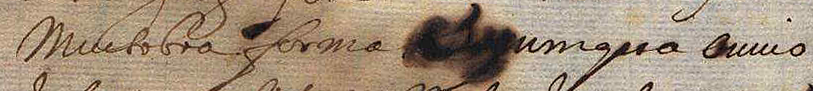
muito boa forma _umqua ouuio
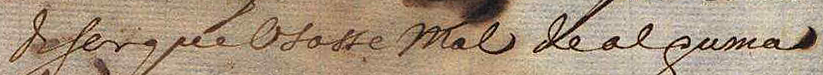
diser que vsasse mal de alguma
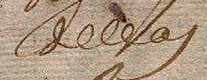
dellas
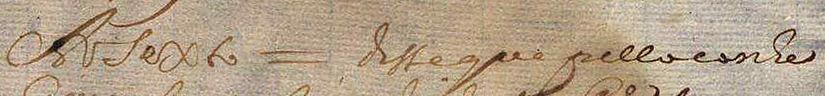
Ao sexto disse que pello conhe
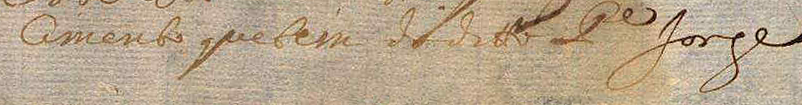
cimento que tem do ditto P.e Jorge
